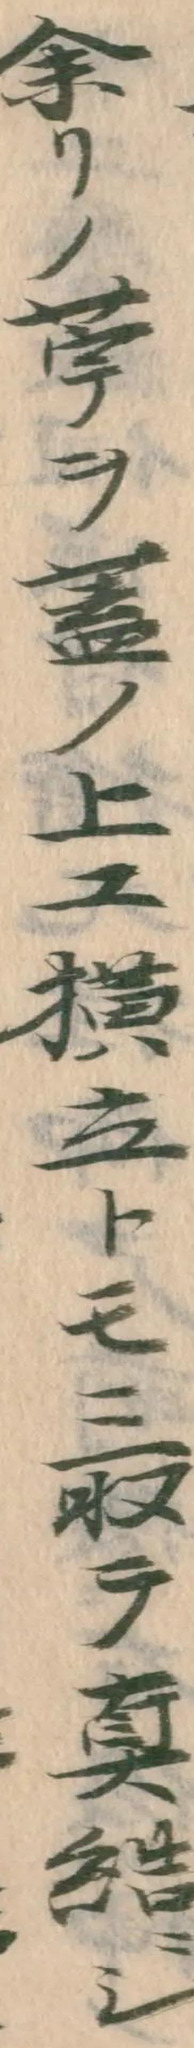余リノ苧ヲ蓋ノ上ヱ横立トモニ取テ真結ニシ
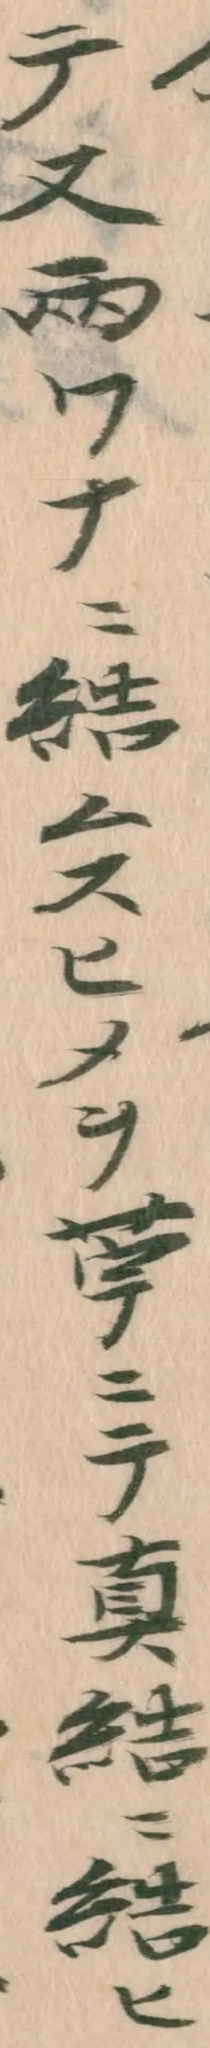テ又両ツナニ結ムスヒメヲ苧ニテ真結ニ結ヒ
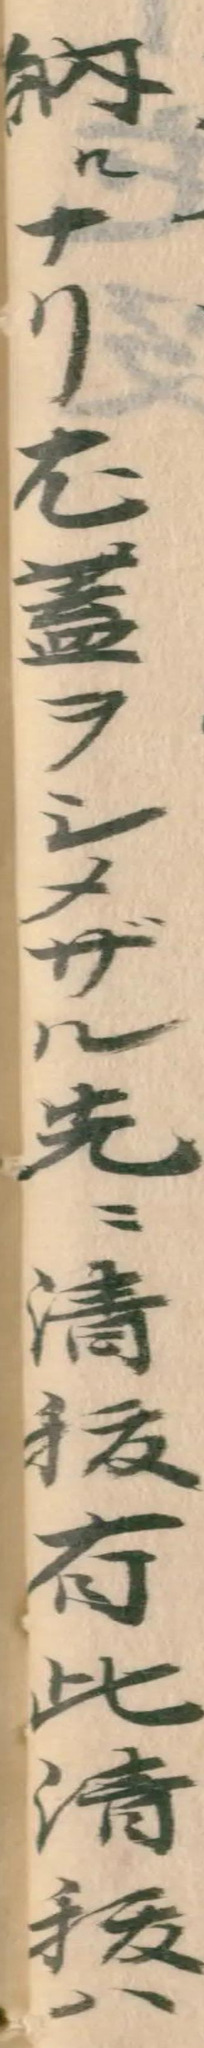納ルナリ尤蓋ヲシメザル先ニ清祓有此清祓ハ
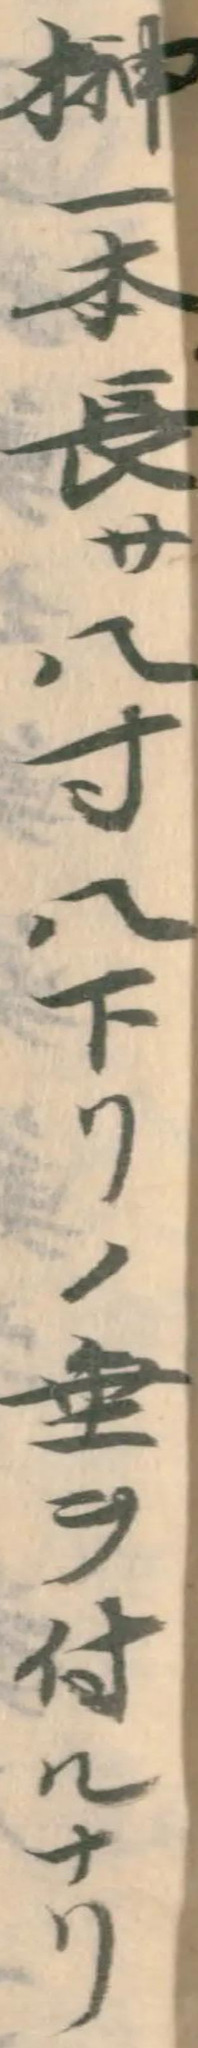榊一本長サ八寸八下りノ垂ヲ付ルナリ
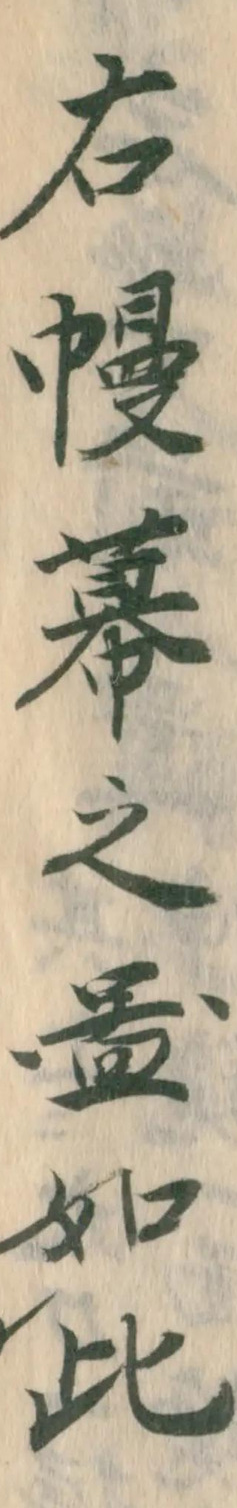右幔幕之図如此

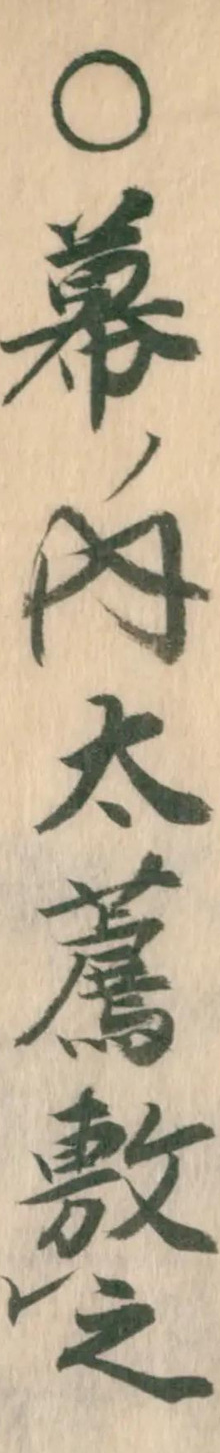○幕ノ内太薦敷之
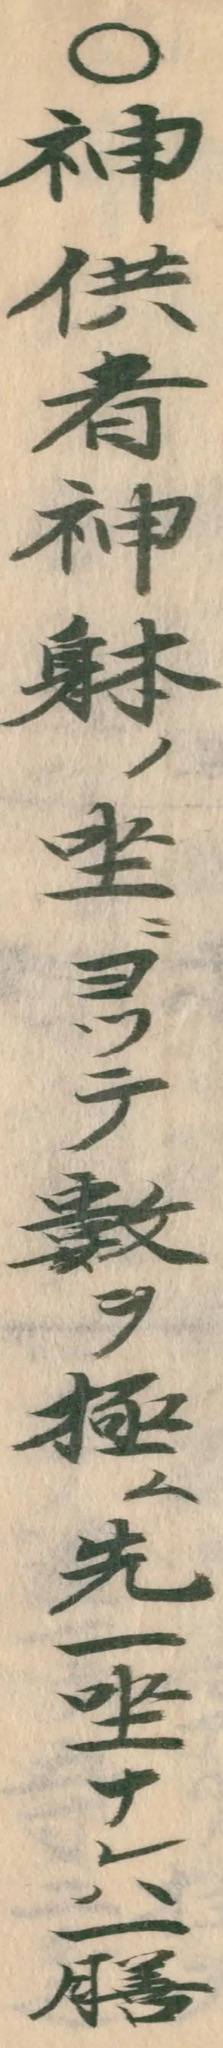○神供者神体ノ坐ニヨツテ数ヲ極ム先一坐ナレハ一膳
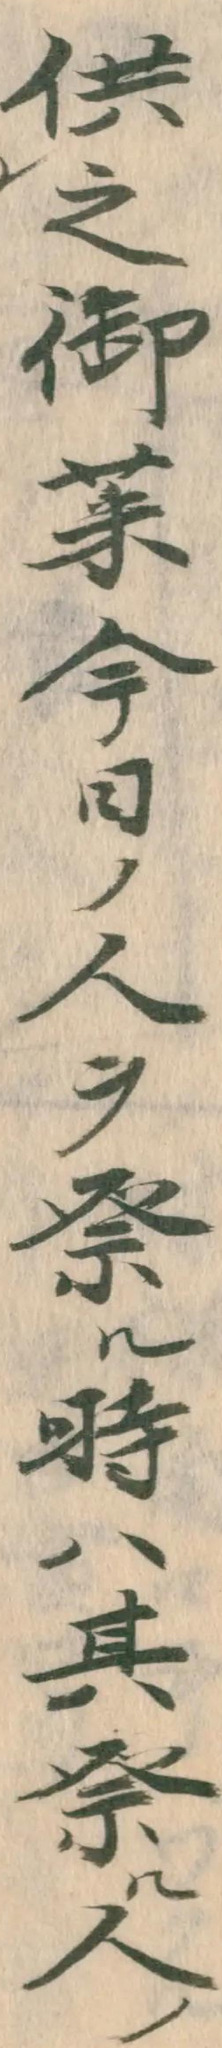供之御薬今日ノ人ヲ祭ル時ハ其祭ル人ノ
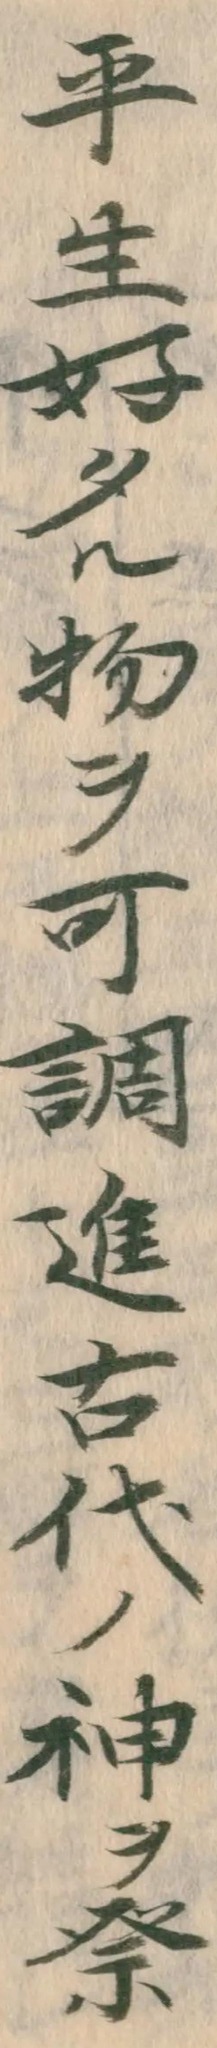平生好タル物ヲ可調進古代ノ神ヲ祭
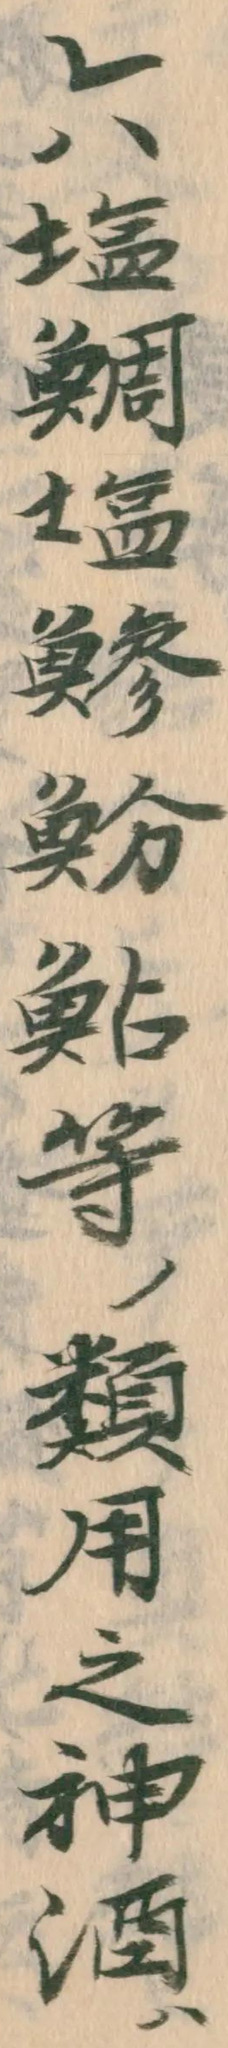レハ塩鯛塩鯵魵鮎等ノ類用之神酒ハ
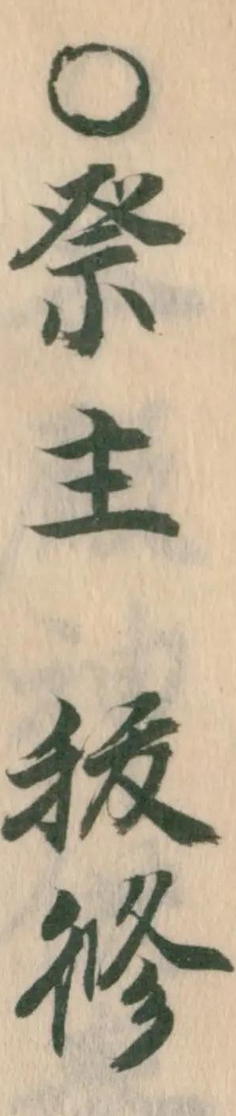○祭主祓修
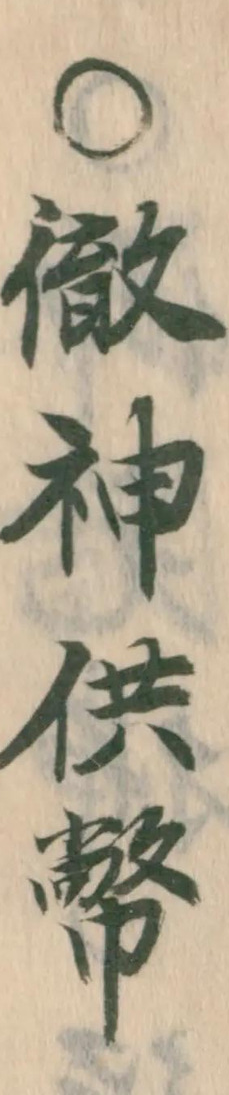○徹神供幣
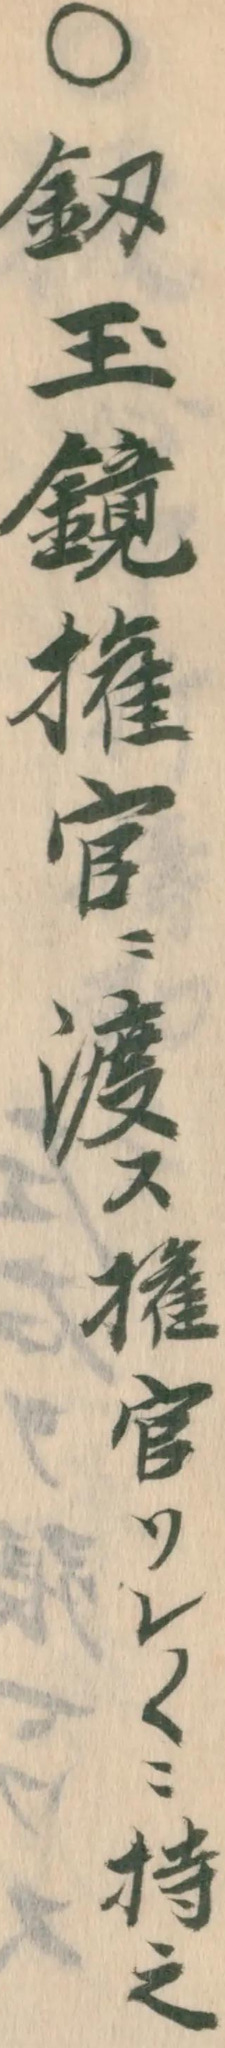○剱玉鏡権官ニ渡ス権官ソレ〳〵ニ持之
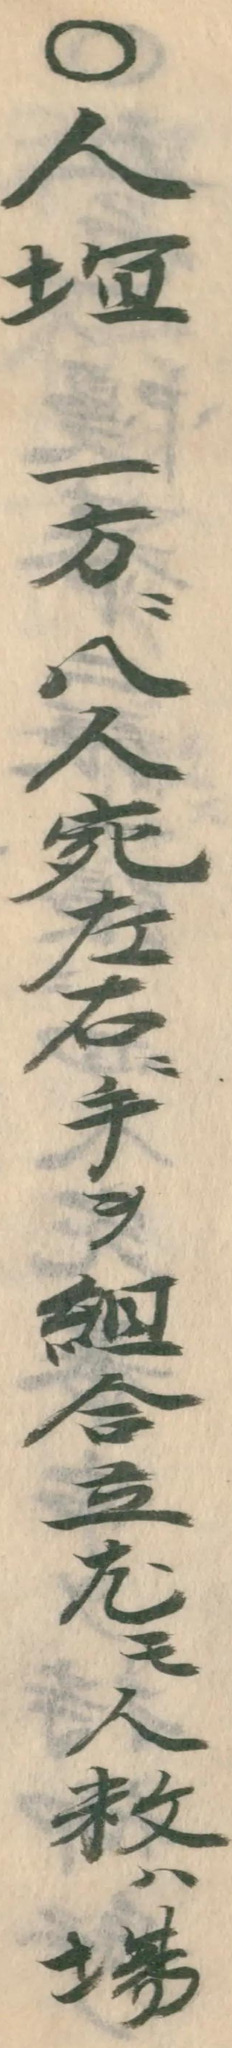○人垣一方ニ八人宛左右ニ手ヲ組合立尤モ人数ハ場
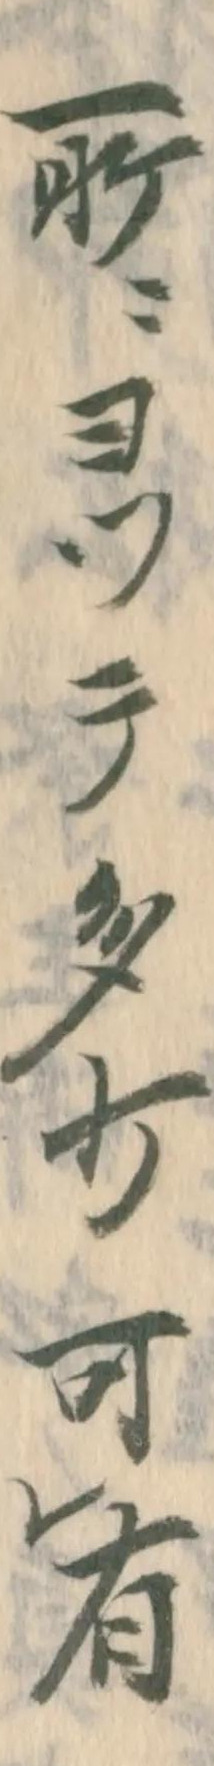所ニヨツテ多少可有

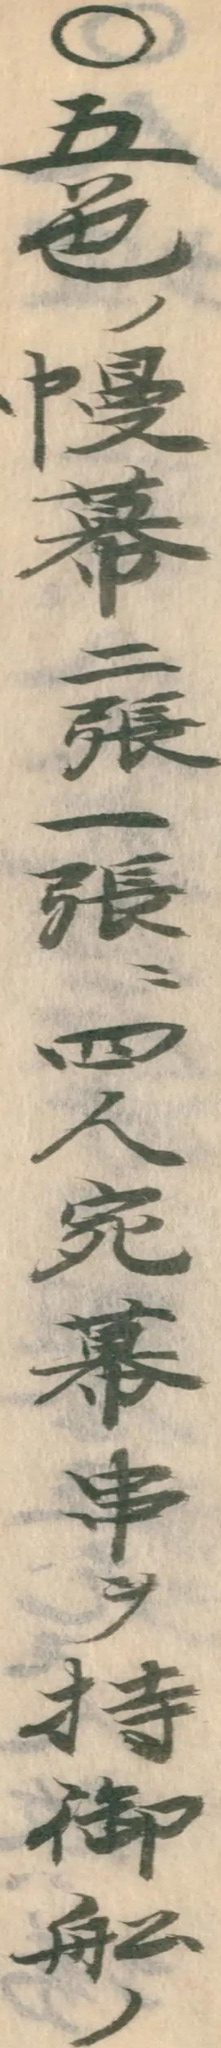○五色ノ幔幕二張一張ニ四人宛幕串ヲ持御船ノ
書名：賀茂社記録. 第91冊
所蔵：国立国会図書館 National Diet Library, JAPAN
